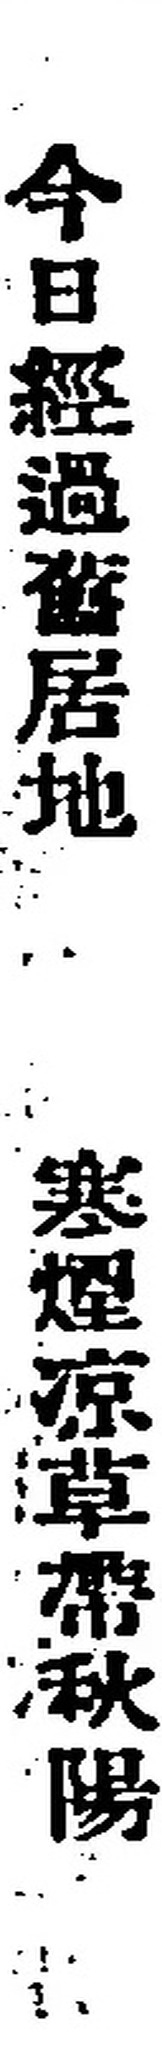今日経過旧居地寒煙涼草帯秋陽
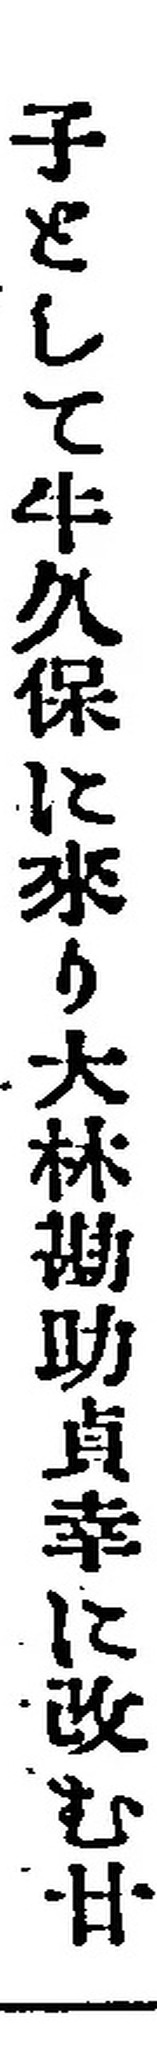子として牛久保に来り大林勘助貞幸に改む廿
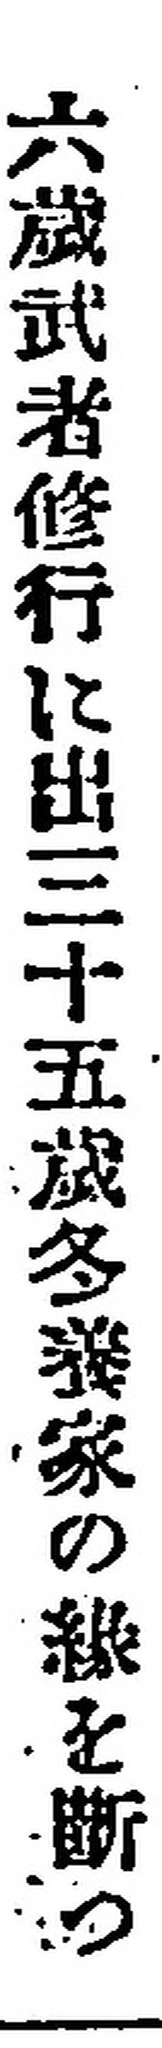六歳武者修行に出三十五歳冬養家の縁を断つ
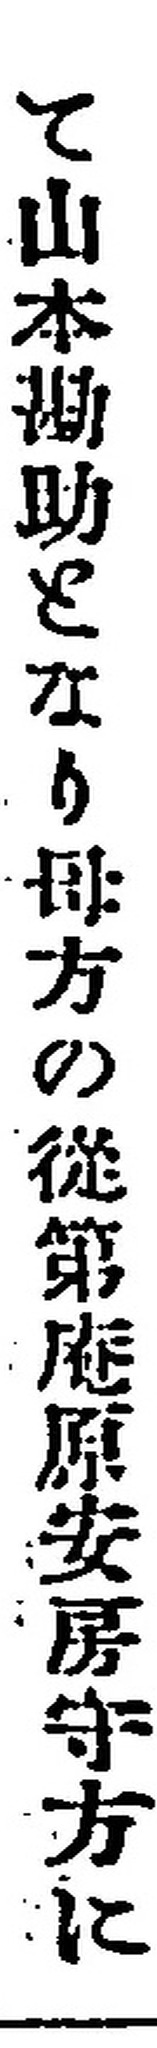て山本勘助となり母方の従第庵原安房守方に
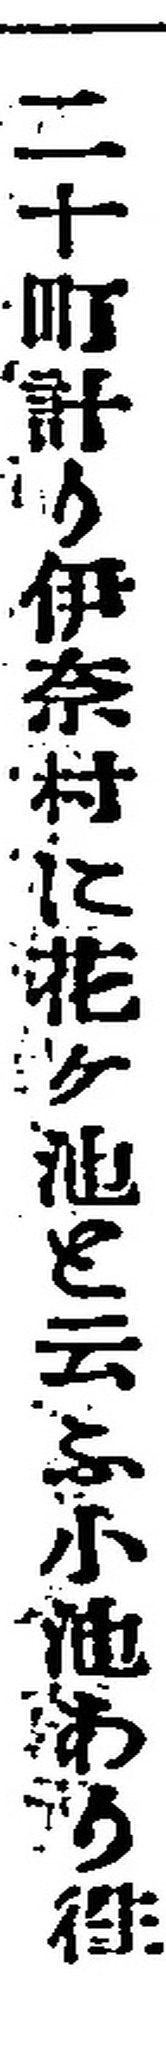二十町計り伊奈村に花ヶ池と云ふ小池あり往
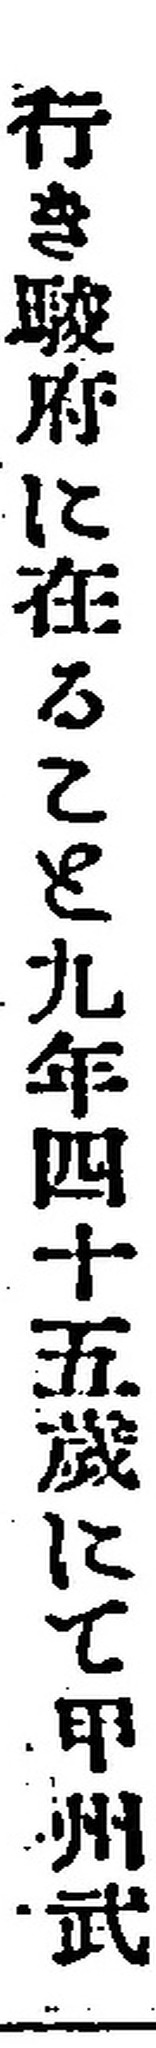行き駿府に在ること九年四十五歳にて甲州武
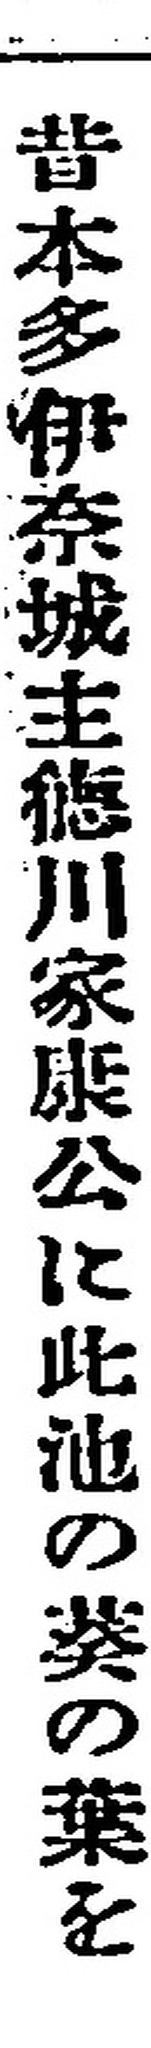昔本多伊奈城主徳川家康公に此池の葵の葉を
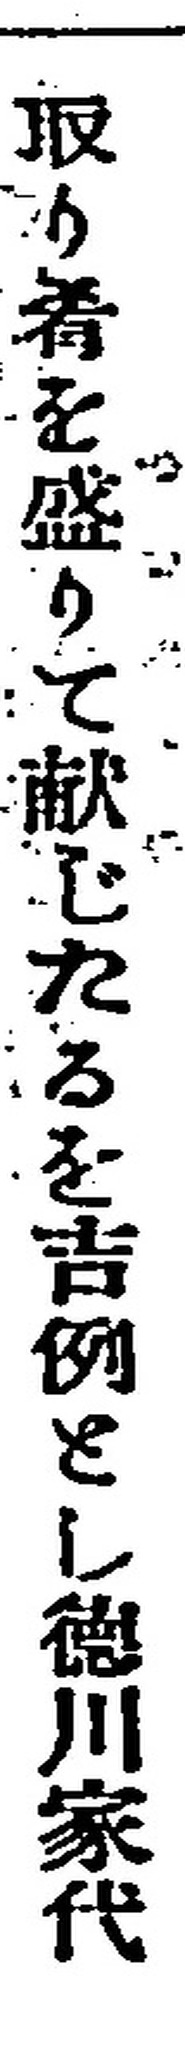取り肴を盛りて献じたるを吉例とし徳川家代
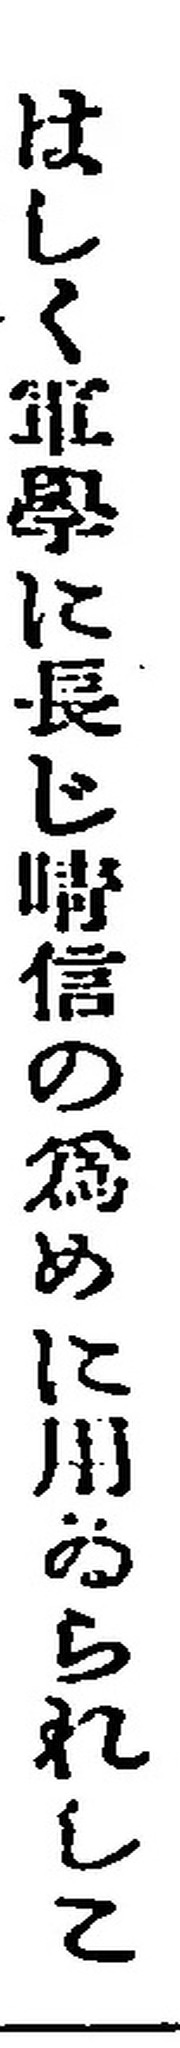はしく軍学に長じ晴信の為めに用ゐられしこ
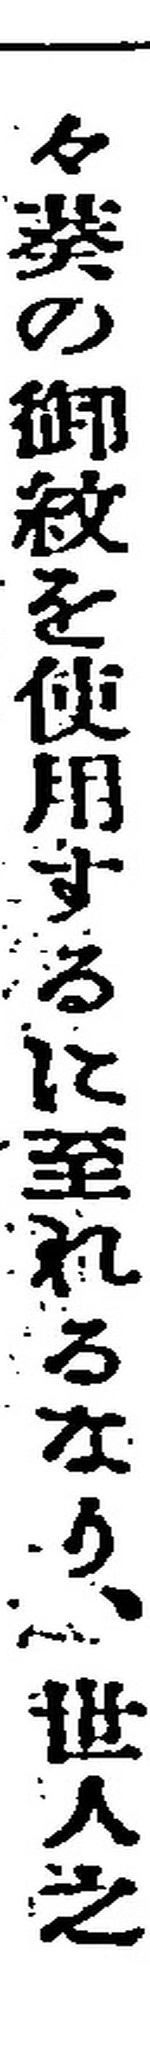々葵の御紋を使用するに至れるなり、世人之
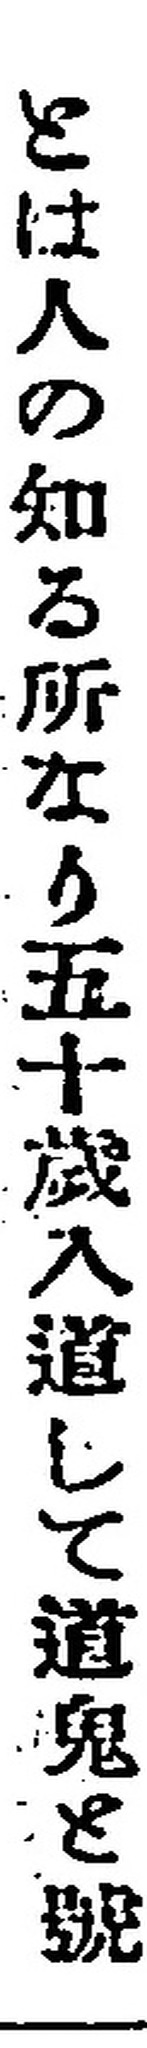とは人の知る所なり五十歳入道して道鬼と号
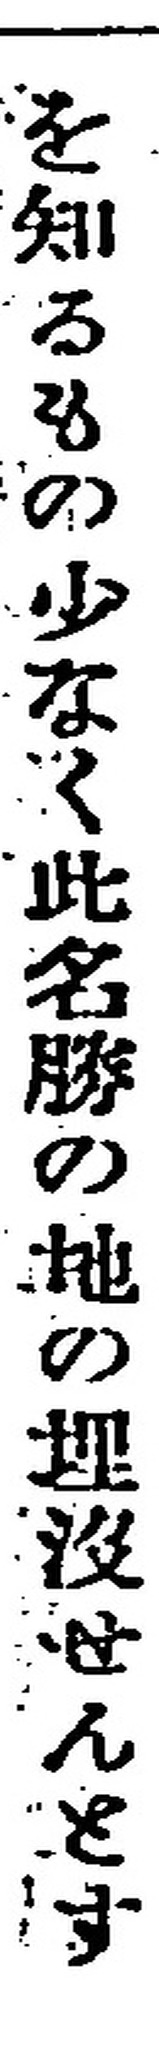を知るもの少なく此名勝の地の埋没せんとす
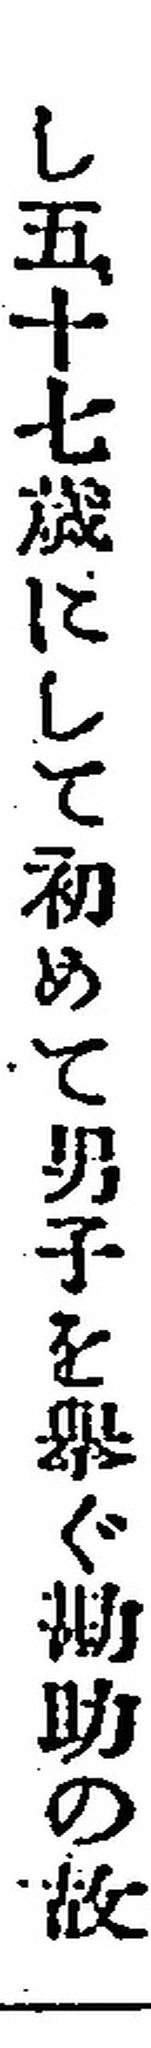し五十七歳にして初めて男子を挙ぐ勘助の故
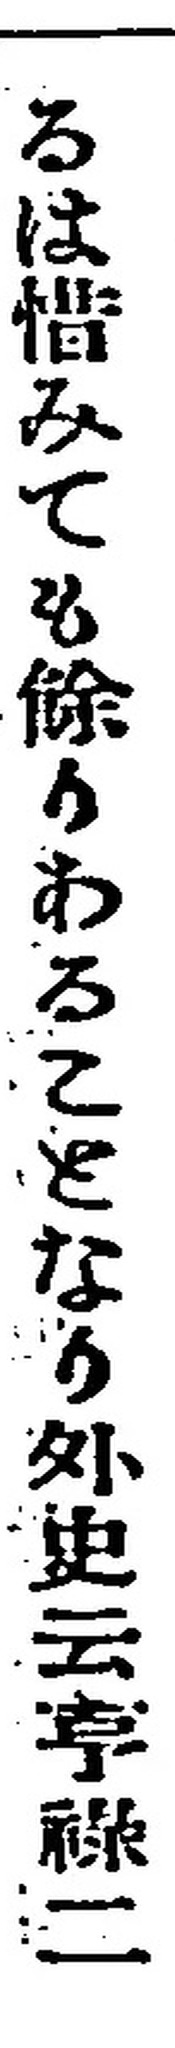るは惜みても余りあることなり外史云亨禄二
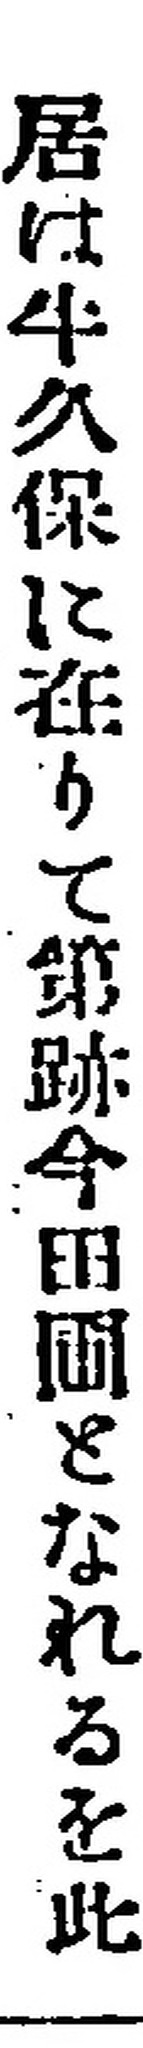居は牛久保に在りて第跡今田圃となれるを此
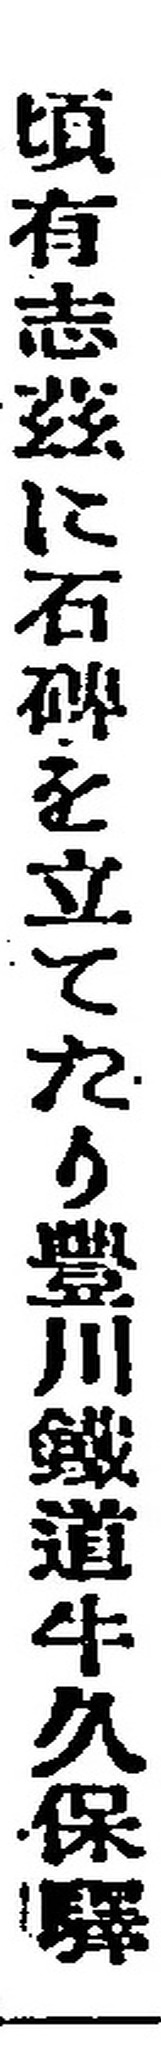頃有志茲に石碑を立てたり豊川鉄道牛久保駅
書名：東参名勝案内
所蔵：国立国会図書館 National Diet Library, JAPAN
